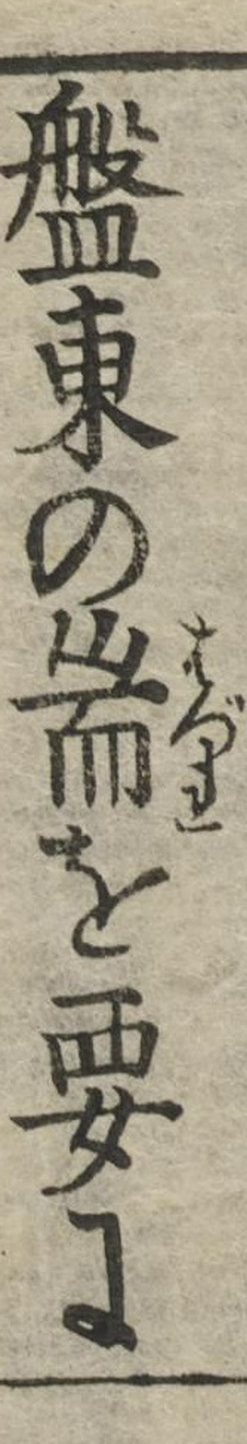盤東の端を要に
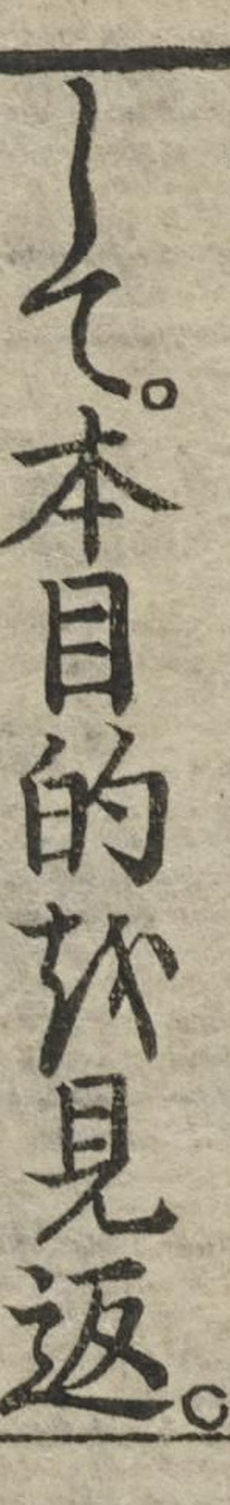して。本目的を見返。
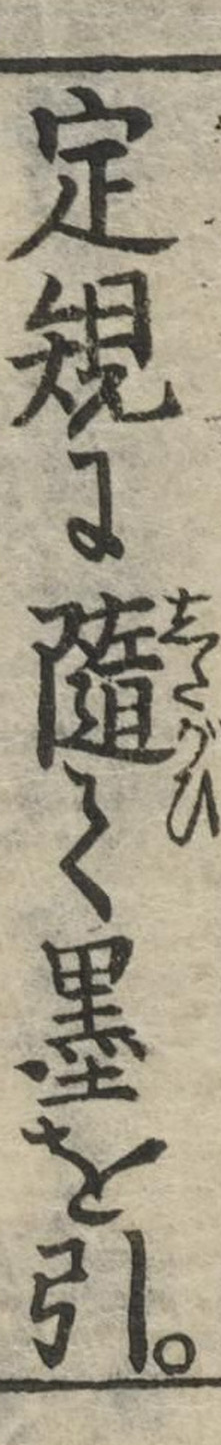定規に随て墨を引。
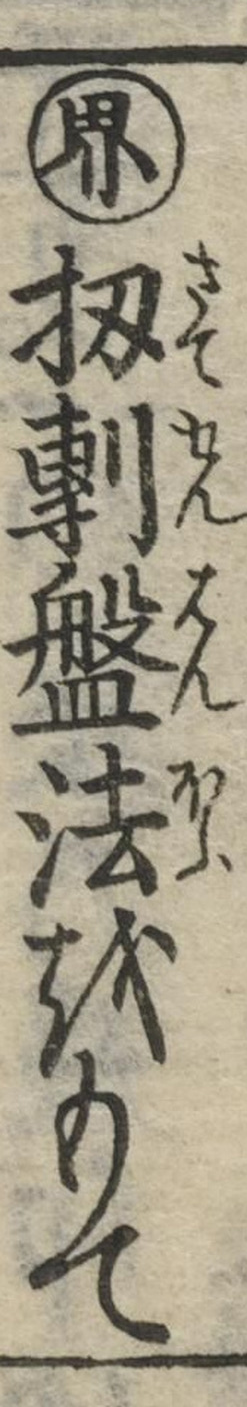界扨剸盤法をもて
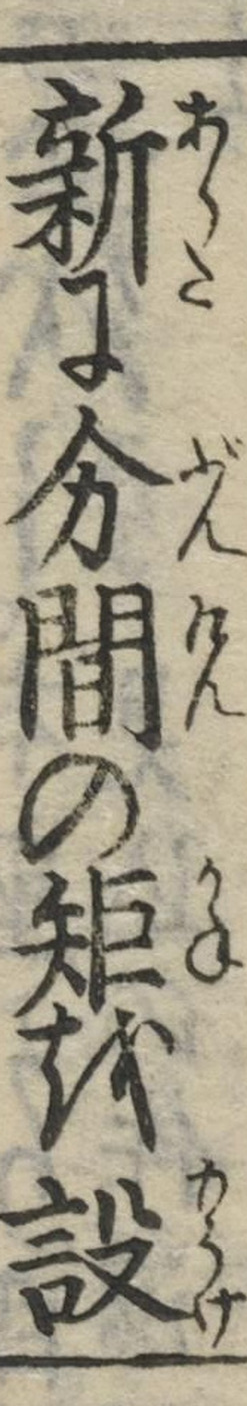新に分間の矩を設
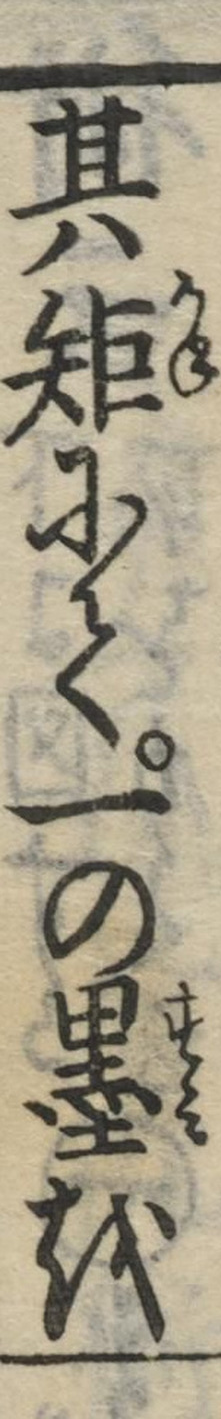其の矩にて。一の墨を
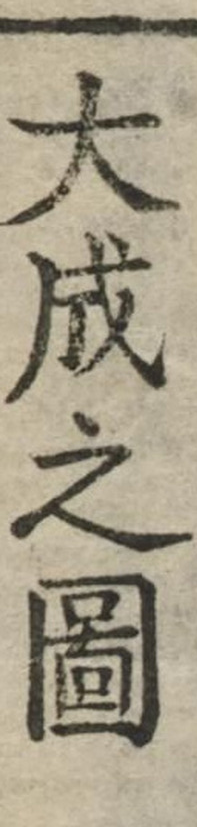大成之図
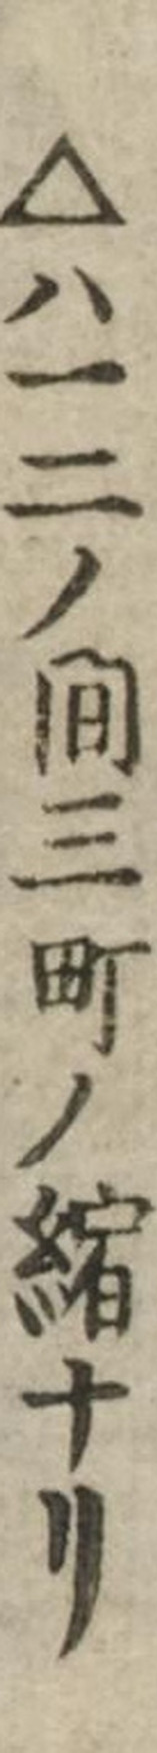△ハ一二ノ間三町ノ縮ナリ
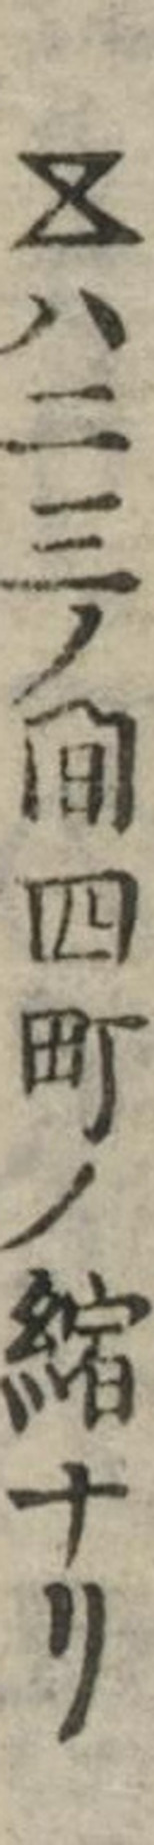▽△ハ二三ノ間四町ノ縮ナリ
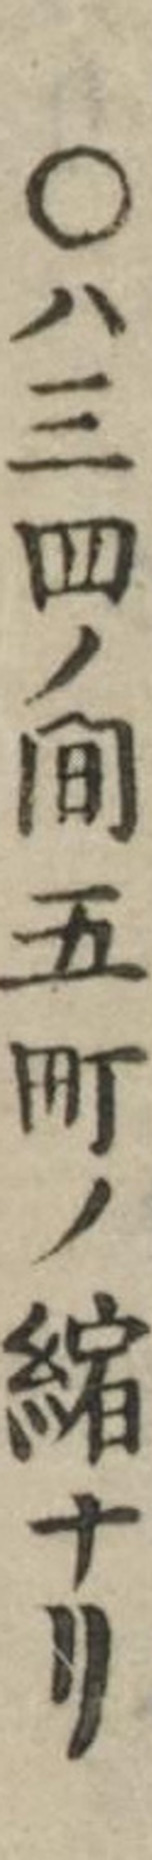○ハ三四ノ間五町ノ縮ナリ
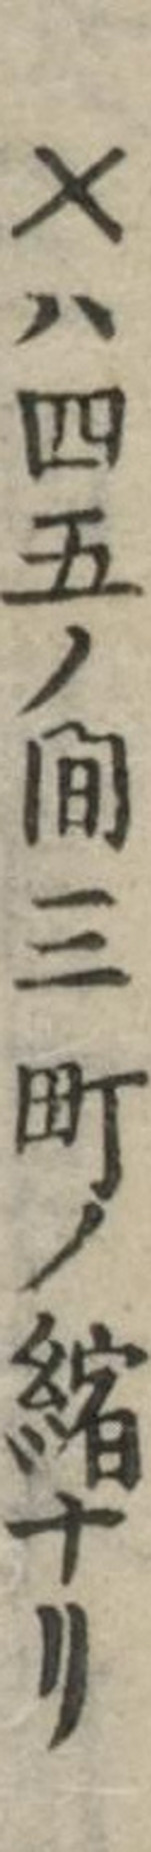✕ハ四五ノ間三町ノ縮ナリ
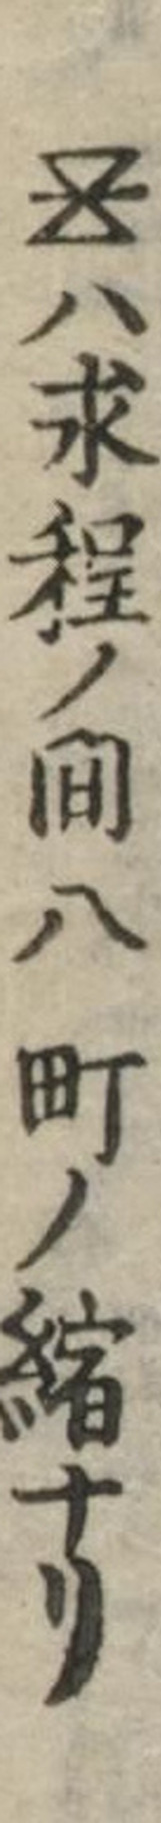▽△ハ求程ノ間八町ノ縮ナリ
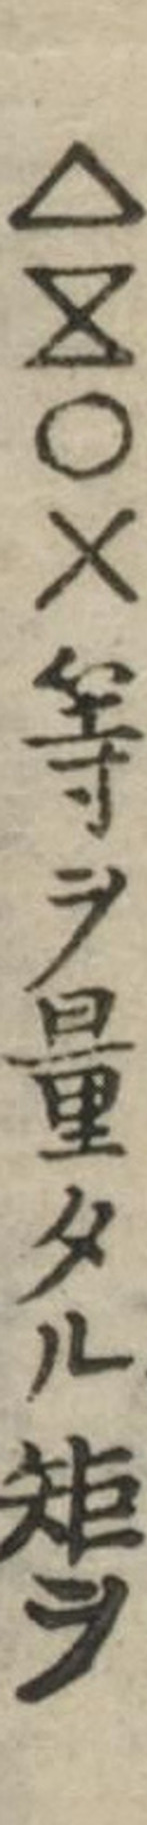△▽△○✕等ヲ量タル矩ヲ
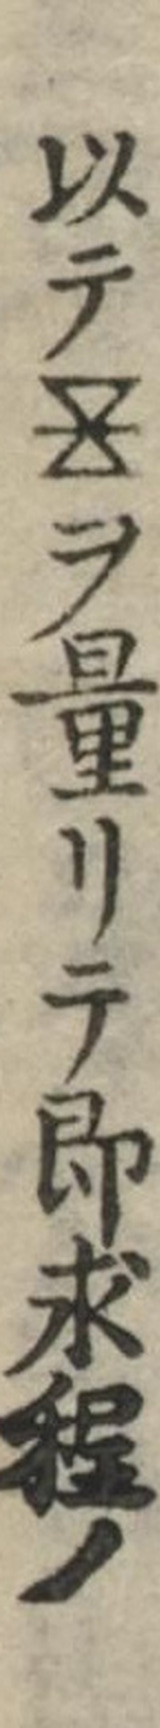以テ▽△ヲ量リテ即求程ノ
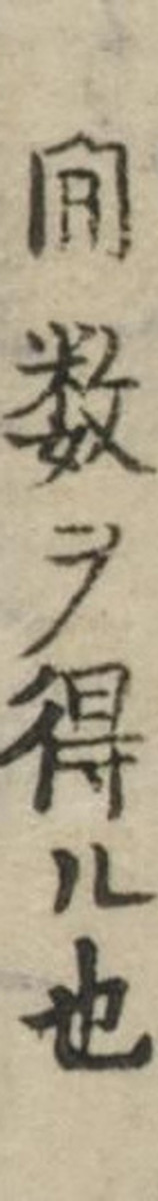間数ヲ得ル也

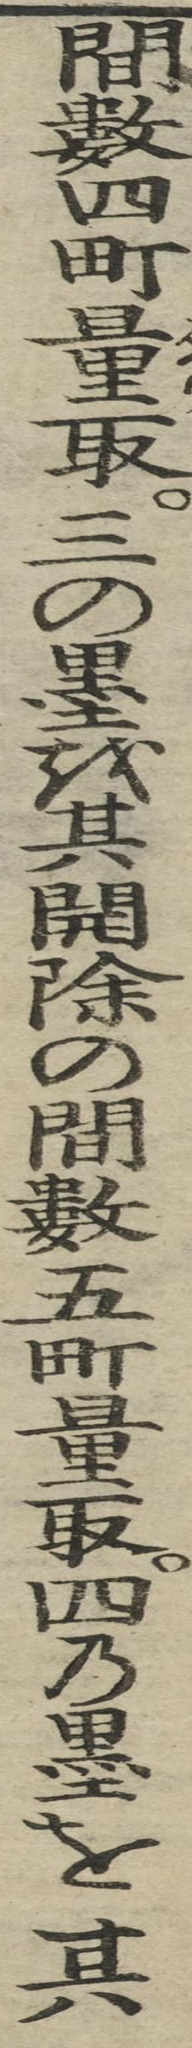間数四町量取。三の墨を其開除の間数五町量取。四の墨を其
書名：量地指南　巻之二（内題）
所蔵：東京大学地震研究所図書室 Earthquake Research Institute Library, The University of Tokyo, JAPAN
